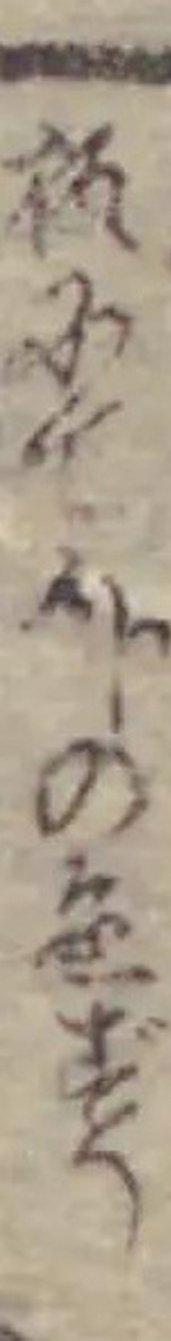板にて外の色ずり
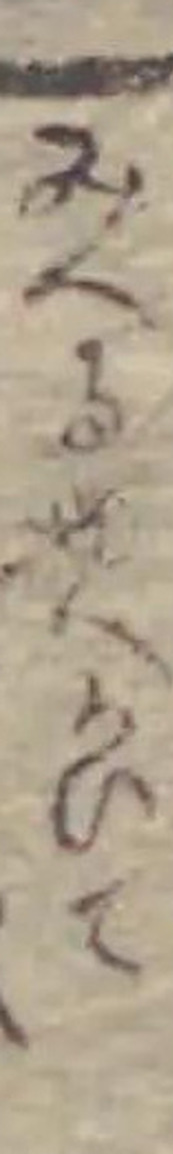みへるゆへかいて
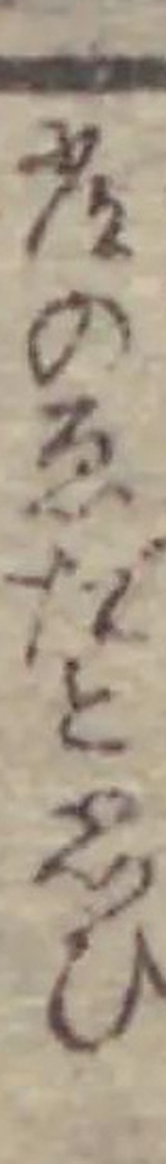常のゑだと思ひ
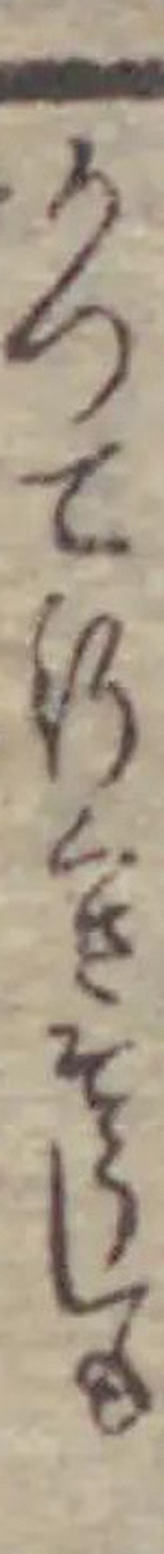かつて行くさそうしも
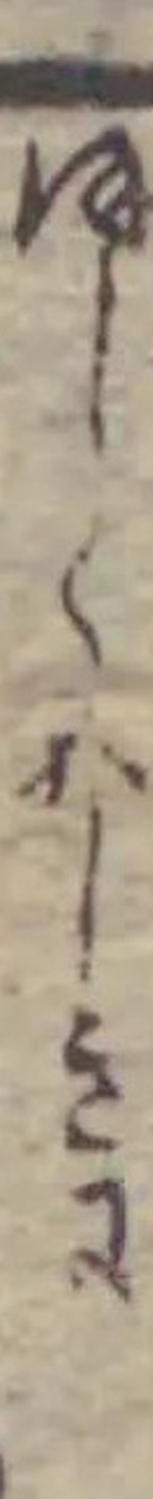同しく五しきに
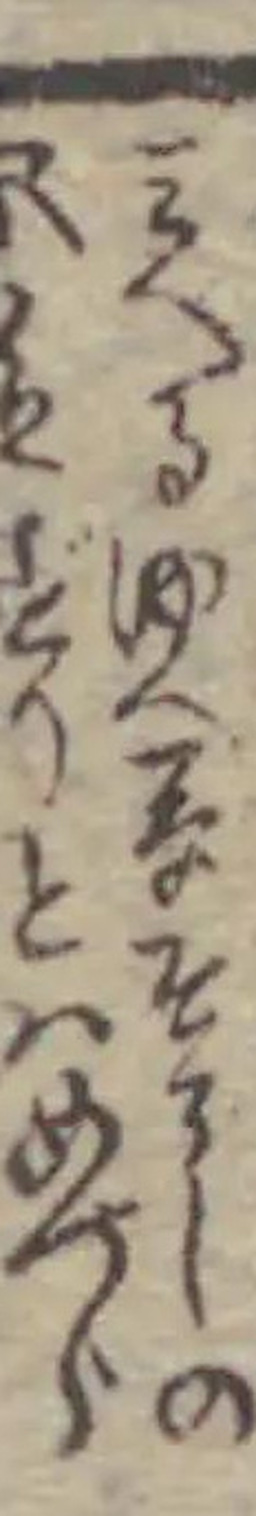五色ずりとはめづら
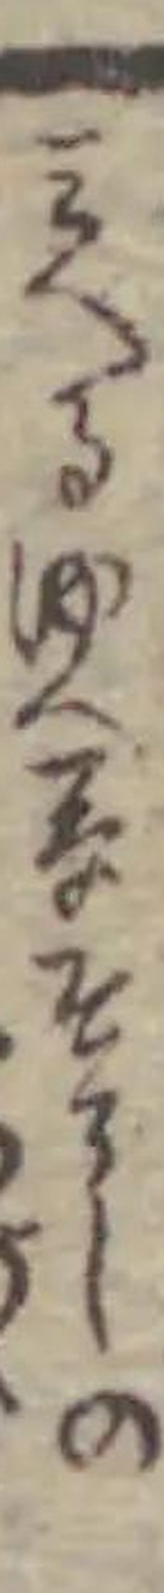みへるゆへ草そうしの
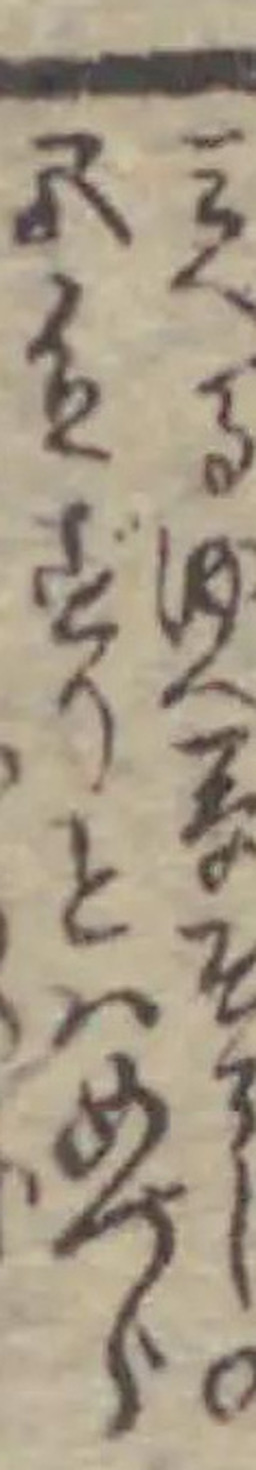五色ずりとはめづら
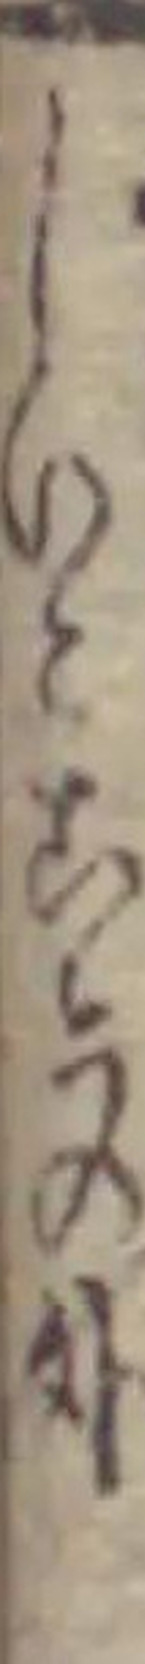しいとことの外
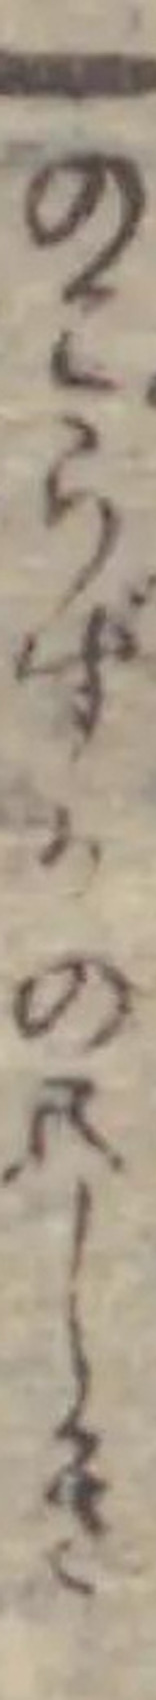のこらずかの五しき
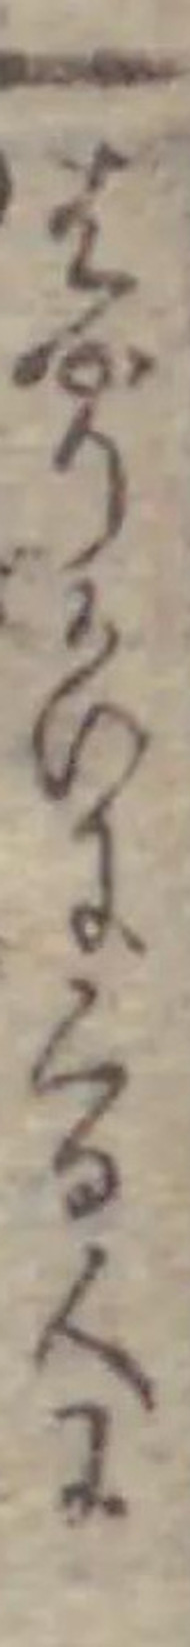はやりかいにくる人に
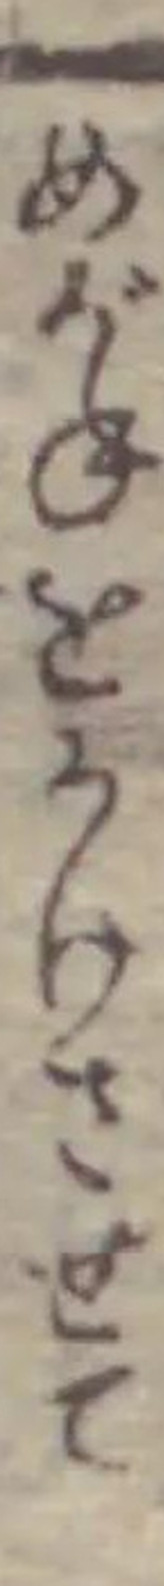めがねをかけさせて
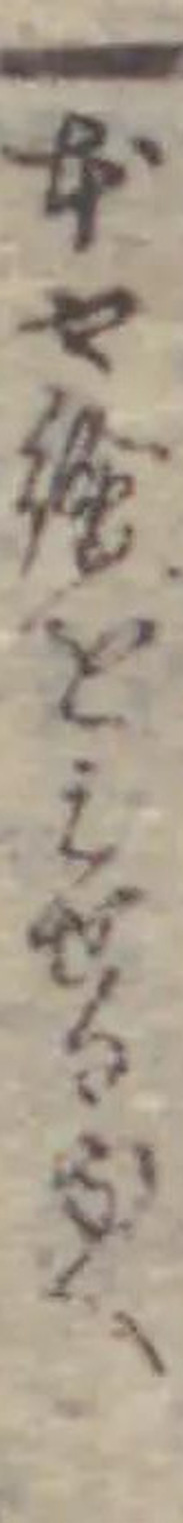本や絵をみせるゆへ
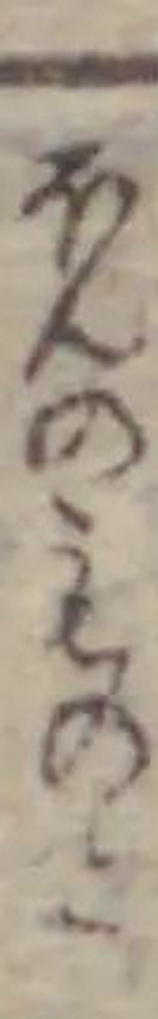ほんのものと
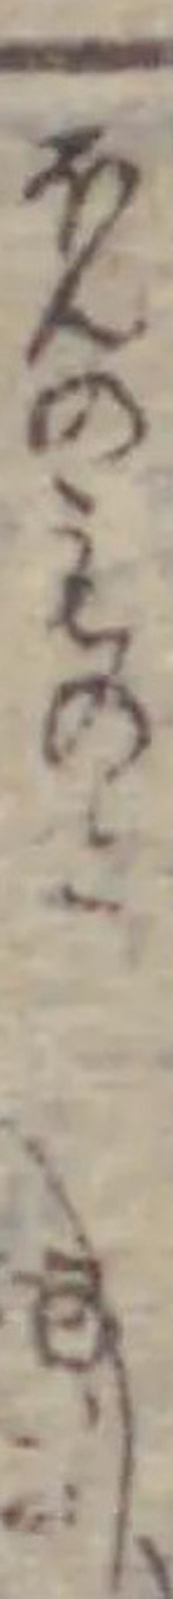ほんのものと
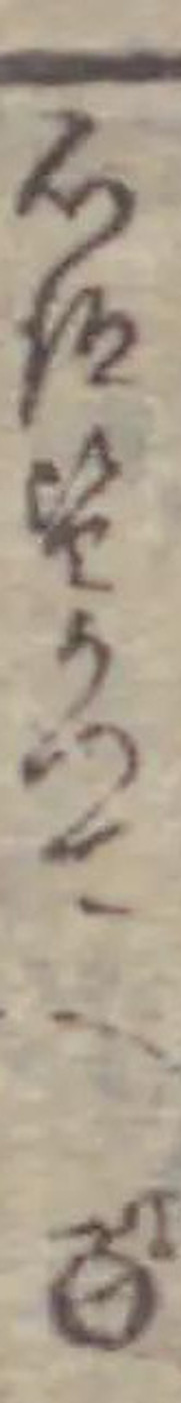心得皆かつて
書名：栄増眼鏡徳 3巻
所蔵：国立国会図書館 National Diet Library, JAPAN
